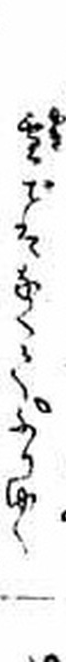雪ではなくてふりゆく
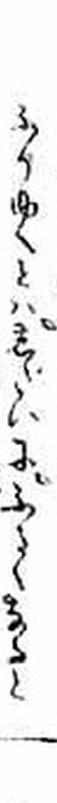ふりゆくとはしだいにふるくなると大臣
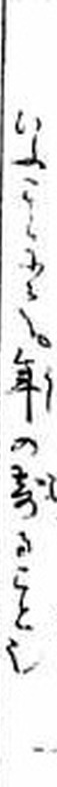いふことにて年の寄ること也
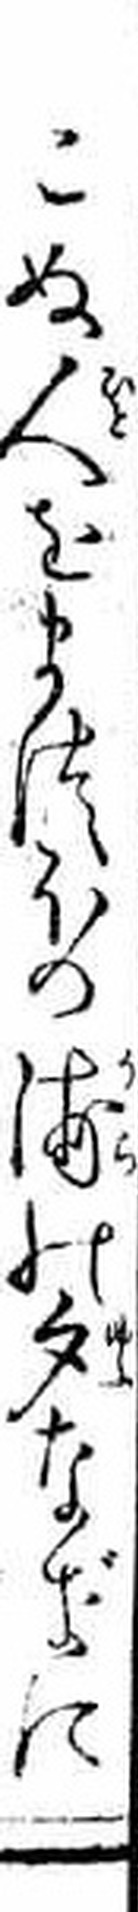こぬ人をまつほの浦の夕なぎに
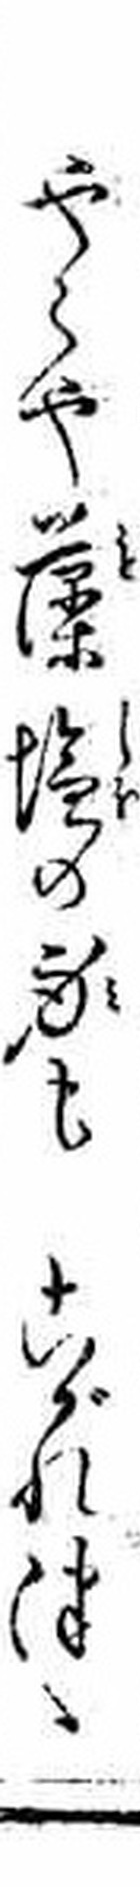やくや藻塩の身もこがれつゝ
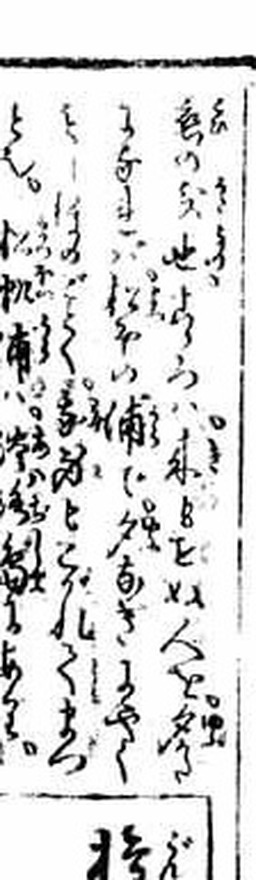になれば松ほの浦で夕なぎにやく権中納
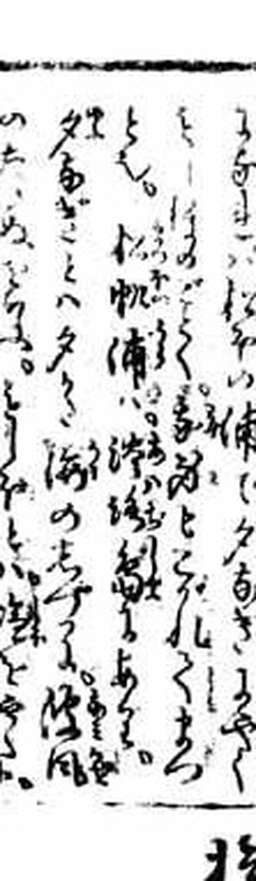と也松帆浦は淡路島にあり言
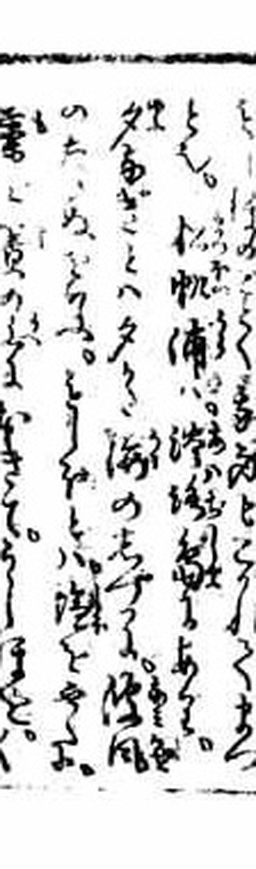夕なぎとは夕かた海のしづかに海風
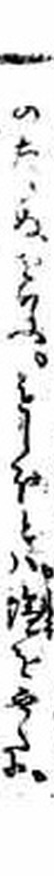のたゝぬをいふもしほとは塩をやくに
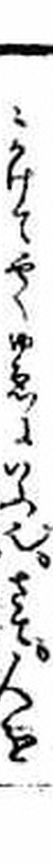にかけてやくゆゑにいふ也さて人を定
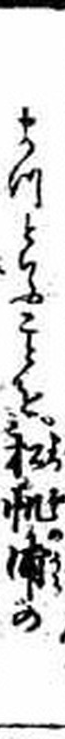まつといふことを松帆浦の
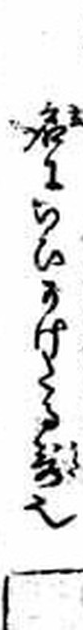名にかけたる哥也家

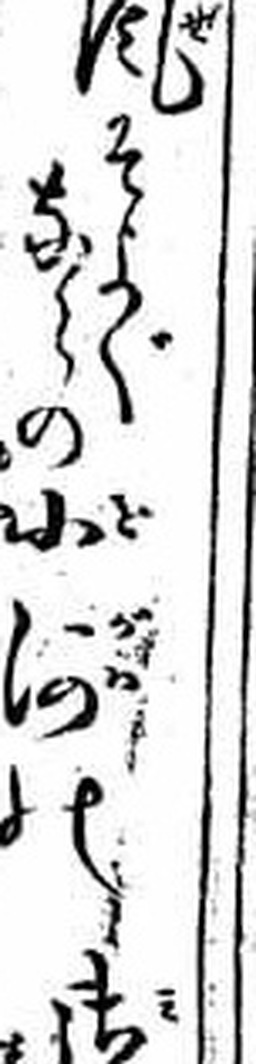ならの小河の
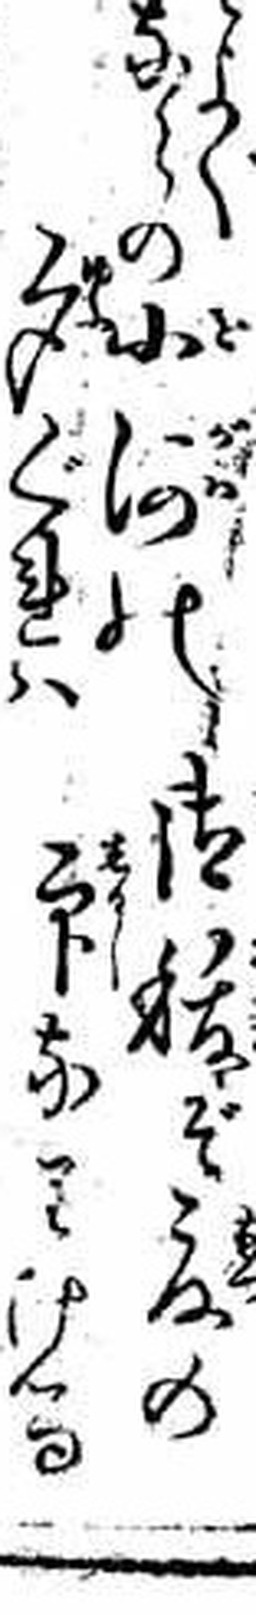夕ぐれはなりける
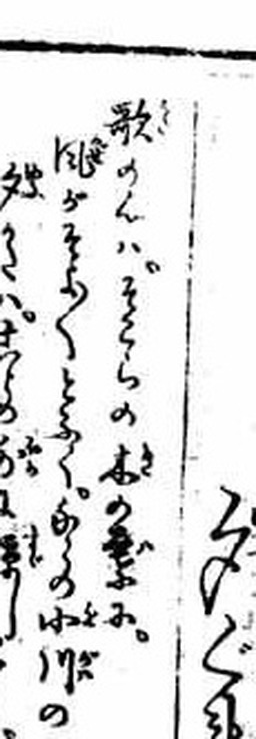歌の心はそこらの木の葉に
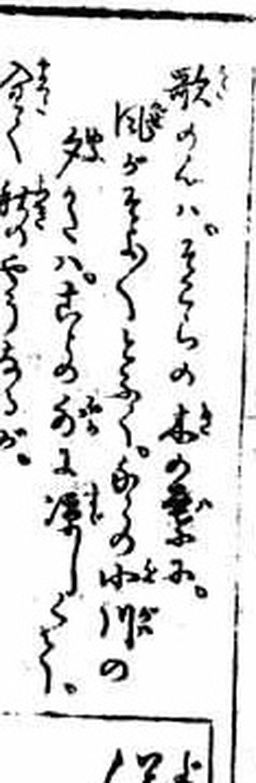風がそよ〳〵とふくならの小川の従二位
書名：小倉百人一首
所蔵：東京学芸大学教育コンテンツアーカイブ
